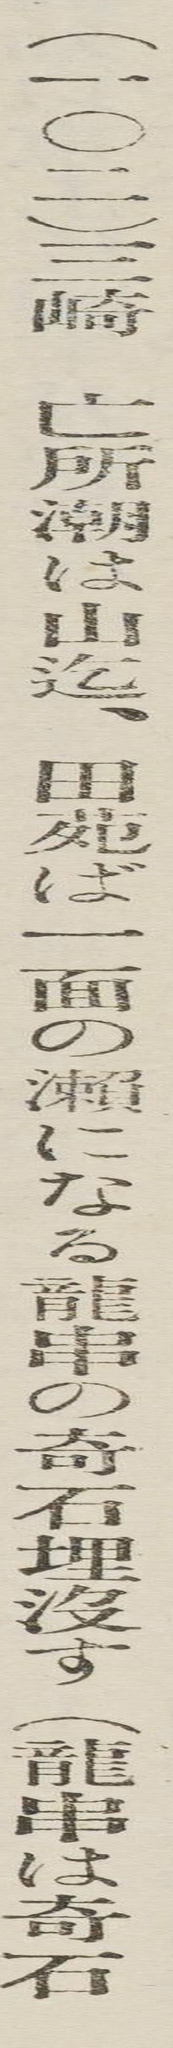三崎亡所潮は山迄、田苑ば一面の瀬になる龍串の奇石埋没す（龍串は奇石
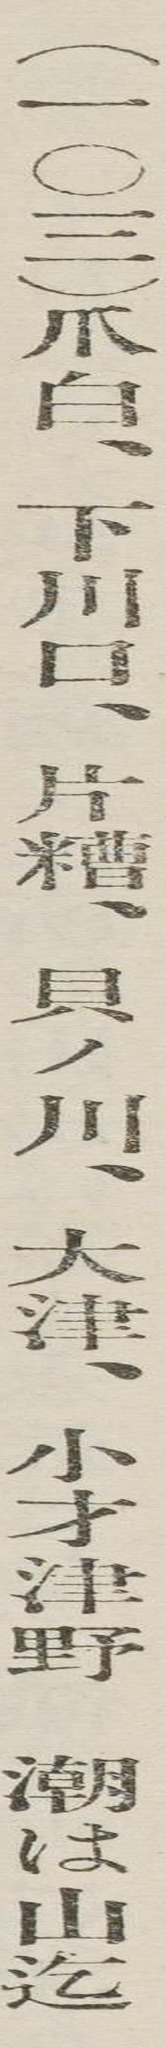爪白、下川口、片糟、貝ノ川、大津、小才津野潮は山迄
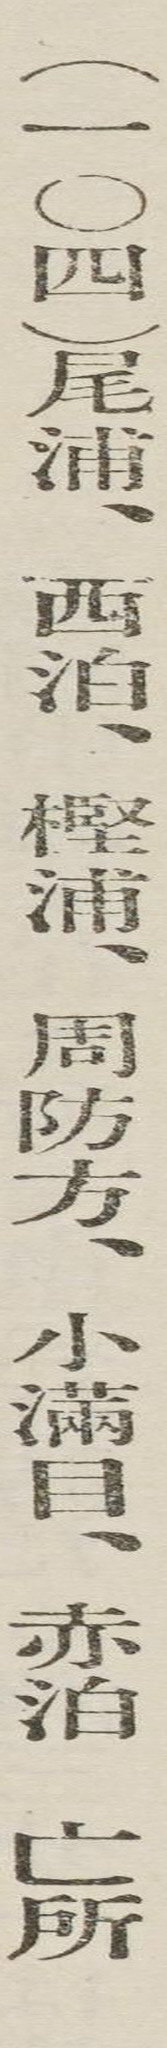尾浦、西泊、樫浦、周防方、小満目、赤泊亡所
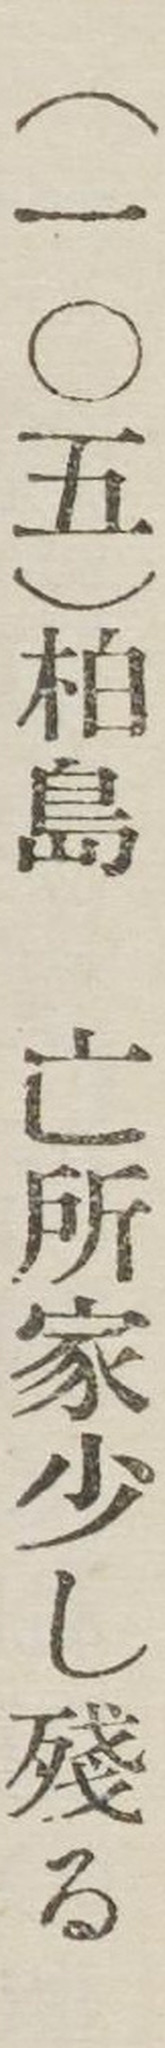柏島亡所家少し残る

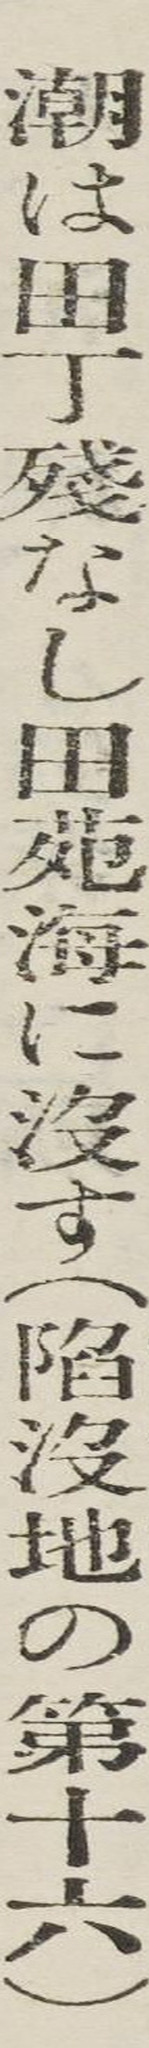湊潮は田丁残なし田苑海に没すの第十六）
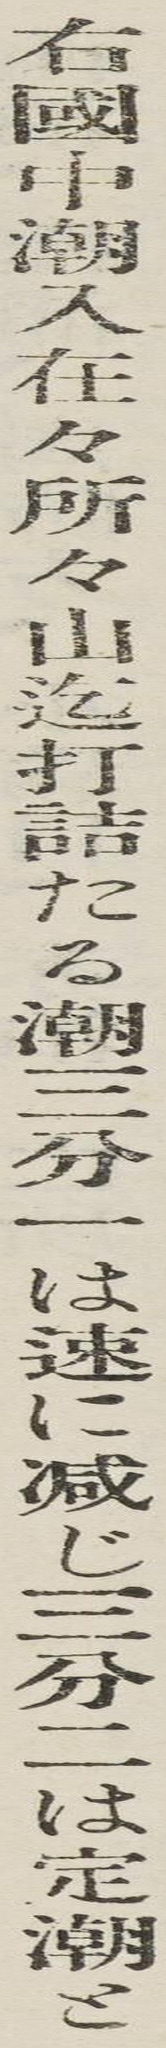右国中潮入在々所々山迄打詰たる潮三分一は速に減じ三分二は定潮と
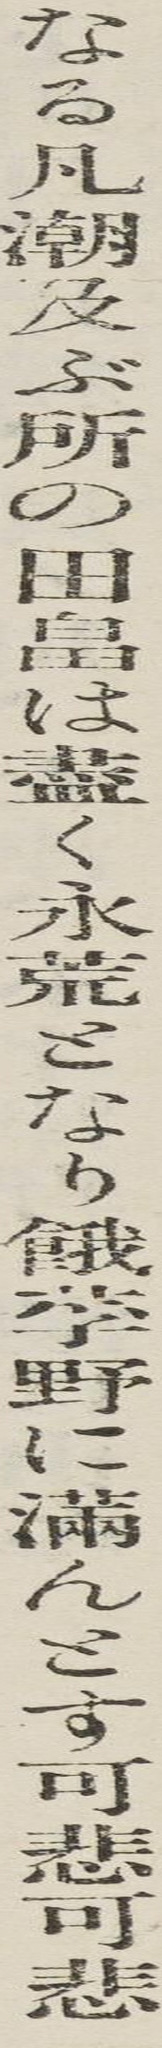なる凡潮及ぶ所の田畠は尽く永荒となり餓莩野に満んとす可悲可悲
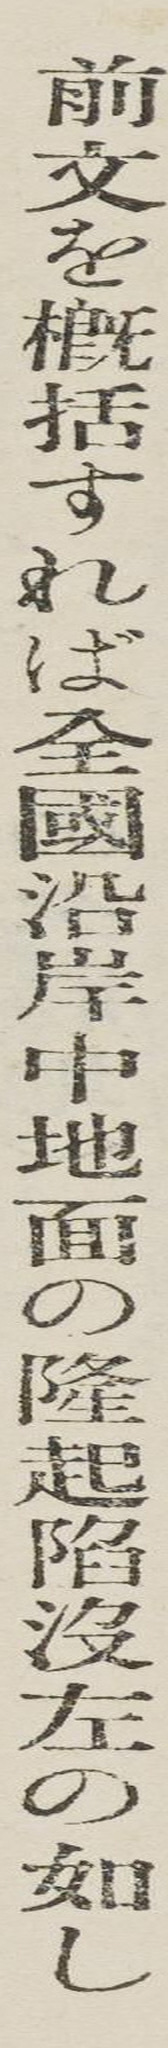前文を概括すれば全国沿岸中地面の隆起陥没左の如し
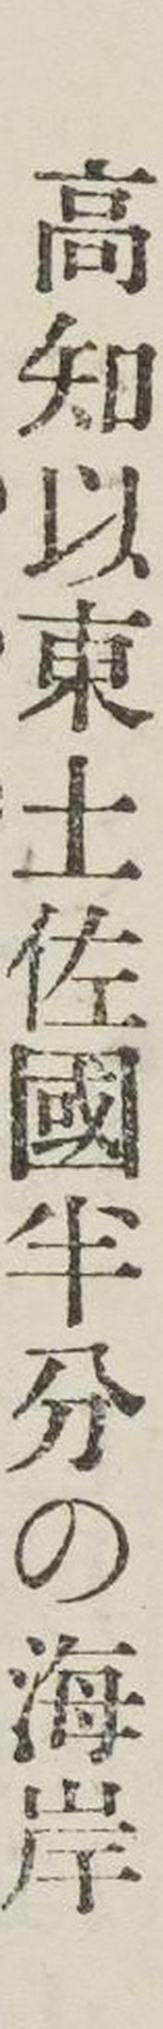高知以東土佐国半分の海岸
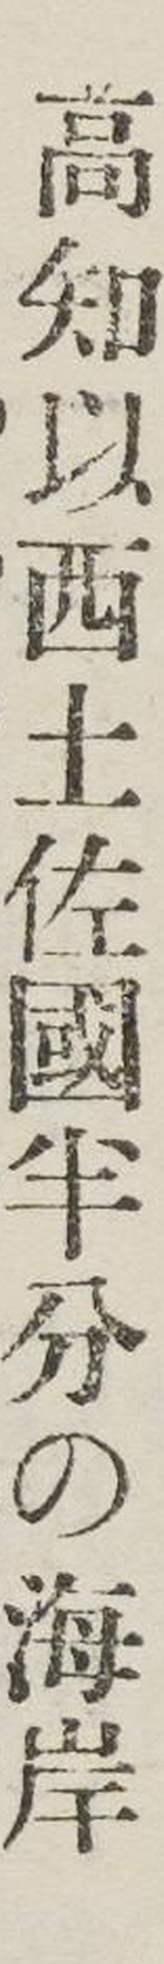高知以西土佐国半分の海岸
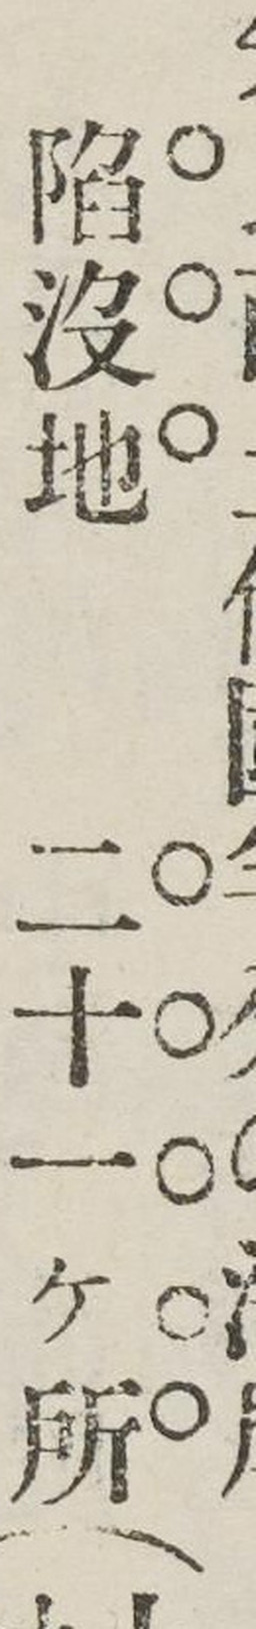陥没地二十一ヶ所
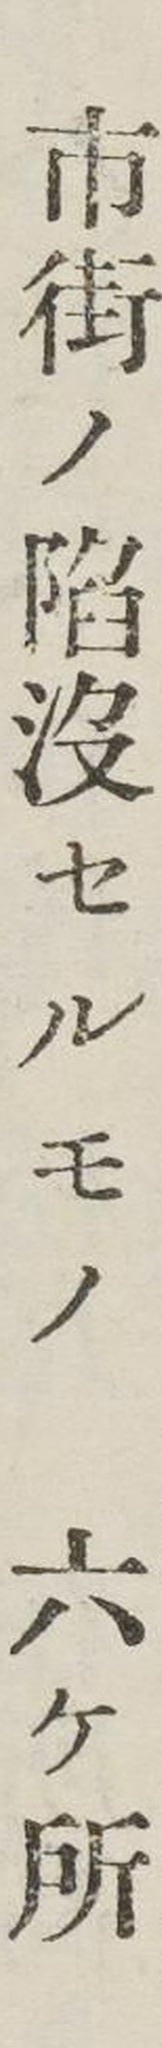市街ノ陥没セルモノ六ヶ所
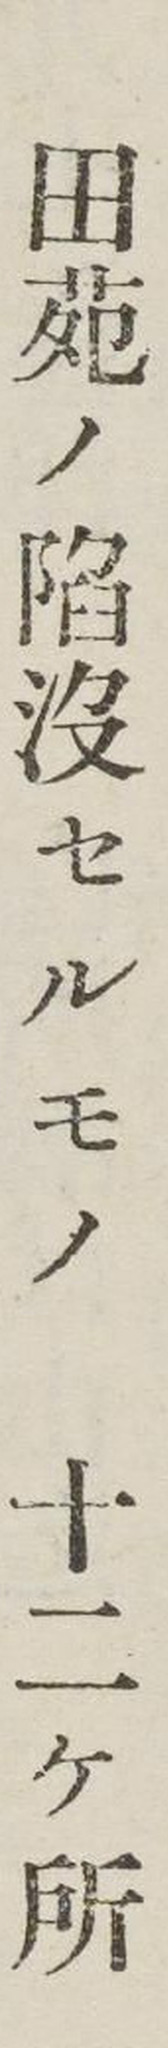田苑ノ陥没セルモノ十二ヶ所
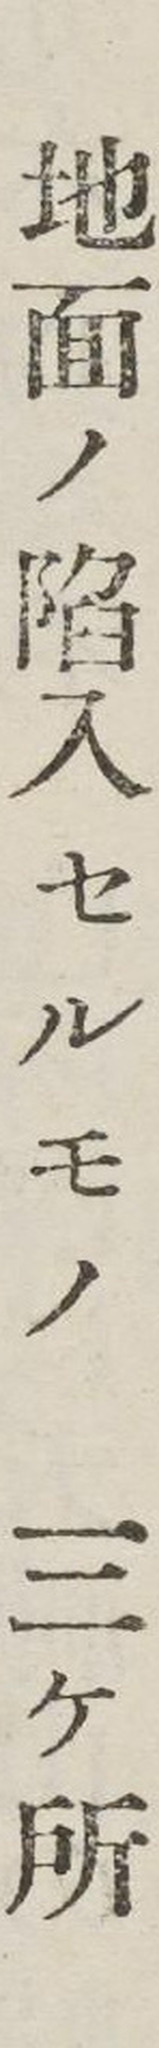地面ノ陥入セルモノ三ヶ所
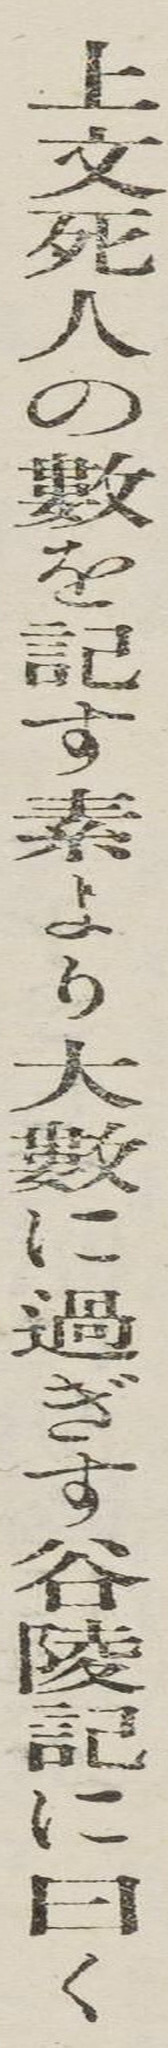上文死人の数を記す素より大数に過ぎす谷陵記に曰く
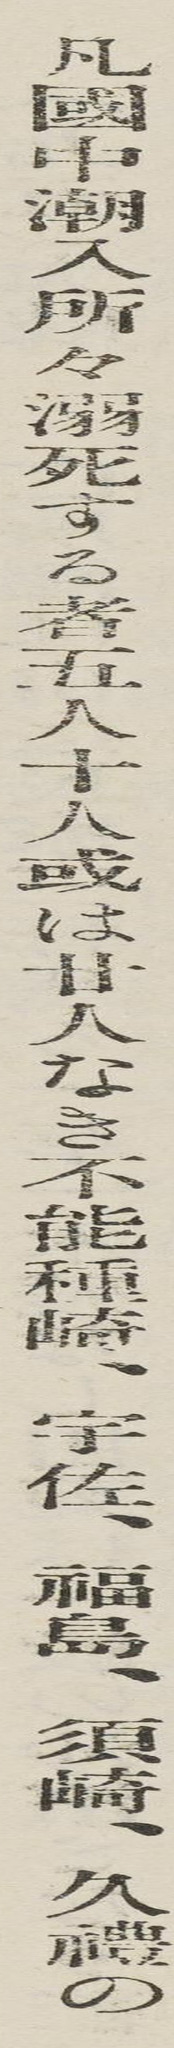凡国中潮入所々溺死する者五人十人或は廿人なき不能種崎、宇佐、福島、須崎、久礼の
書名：土佐古今ノ地震
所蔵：東京大学地震研究所図書室 Earthquake Research Institute Library, The University of Tokyo, JAPAN
